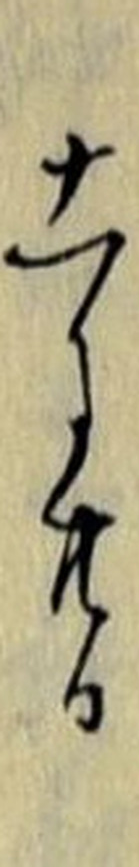十一月廿日
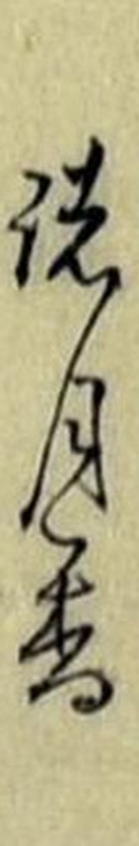諸月番
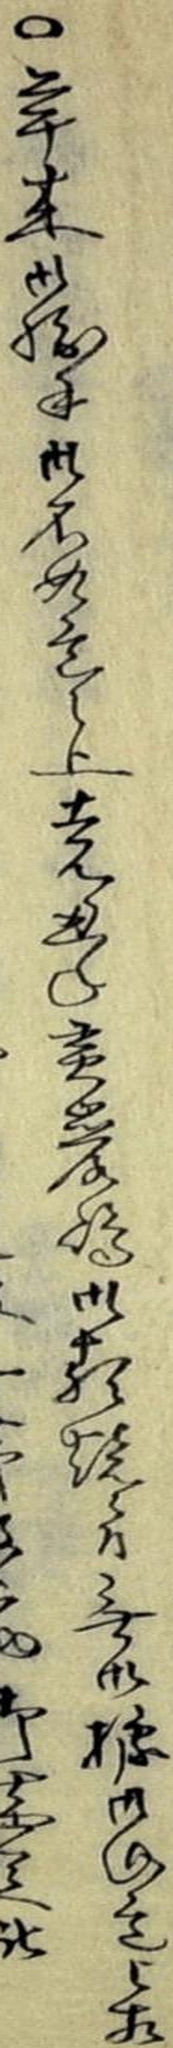○年来御勝手御不如意之上去ル丑年霊巖島御類焼ニ付無御拠御趣意被相
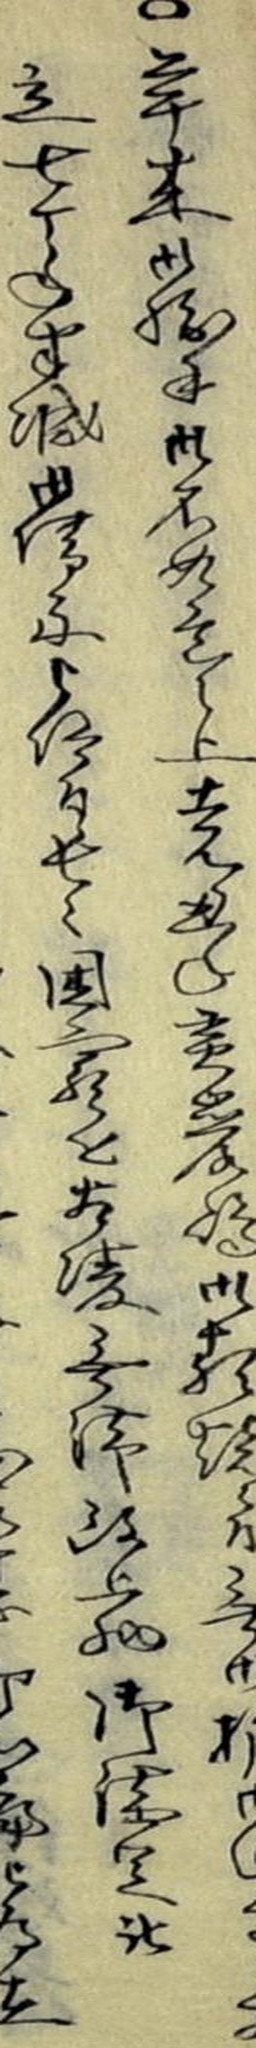立七ケ年半減御借米被仰付長々困窮を相凌無滞致上納御満足被
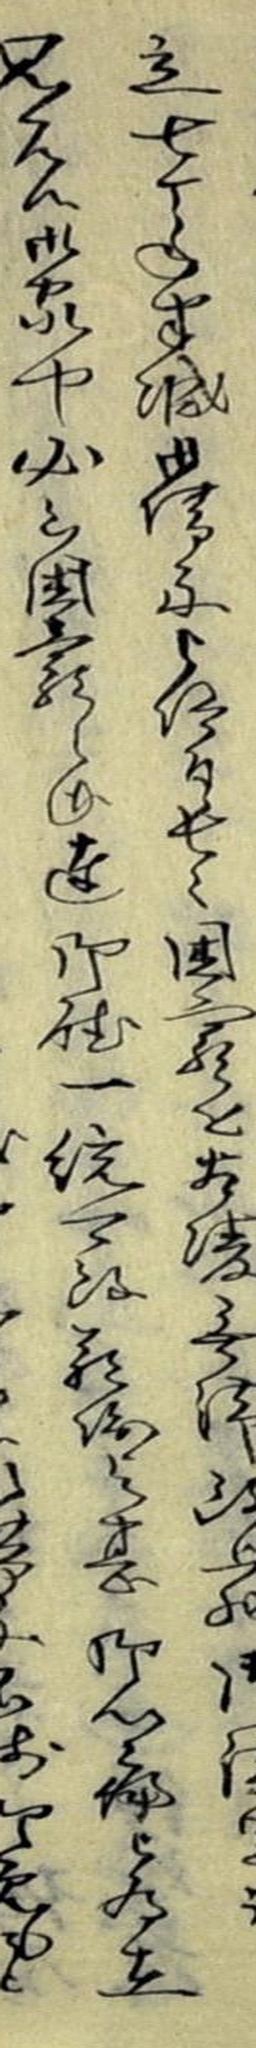思召候御家中必至困窮之趣達御聴一統可致難儀与甚御心痛被為在
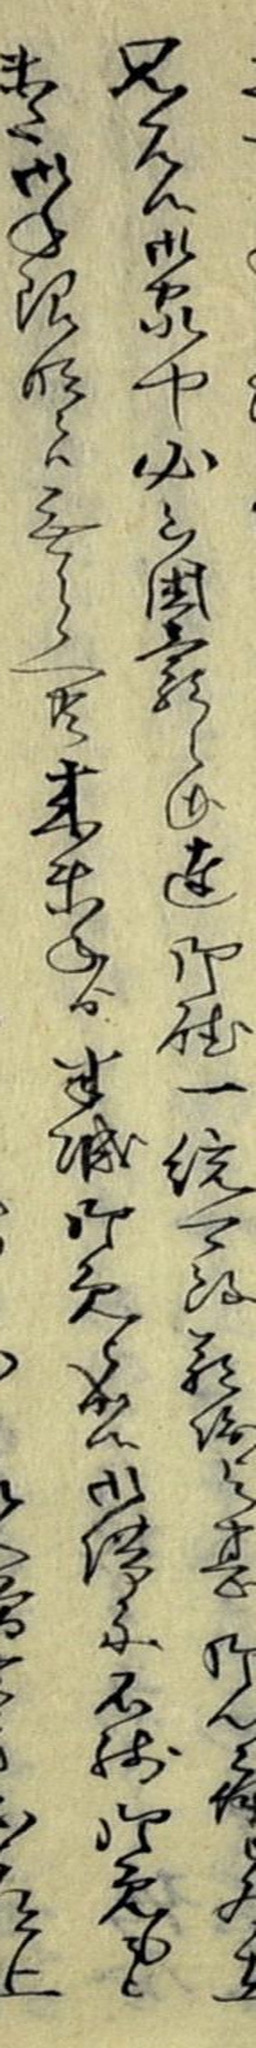未た御年限明ニハ無之候へ共来未年ゟ半減御免被成候御借米不残御免も被
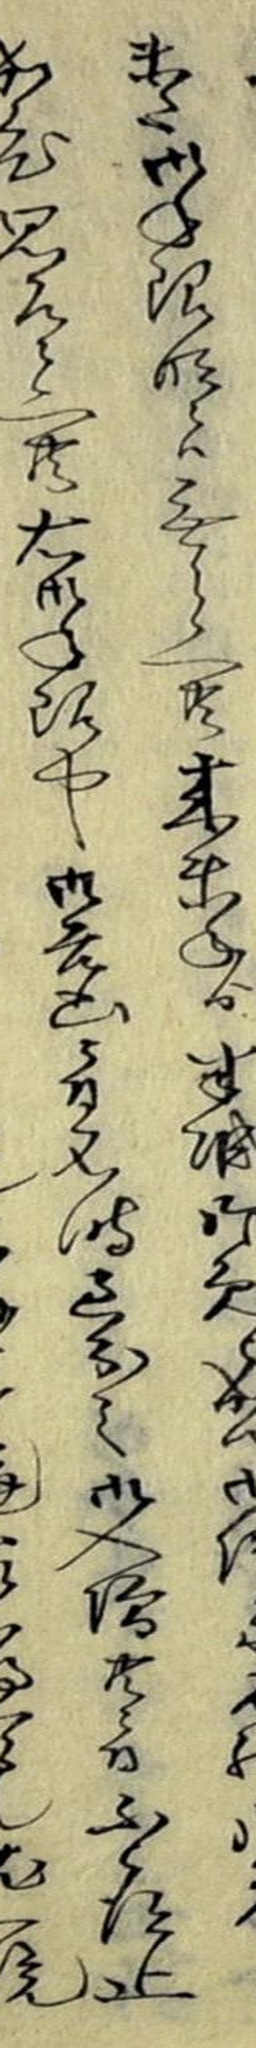成度思召ニ候へ共右年限中御吉凶ニ付不時過分之御入増共ニ付不被仰止
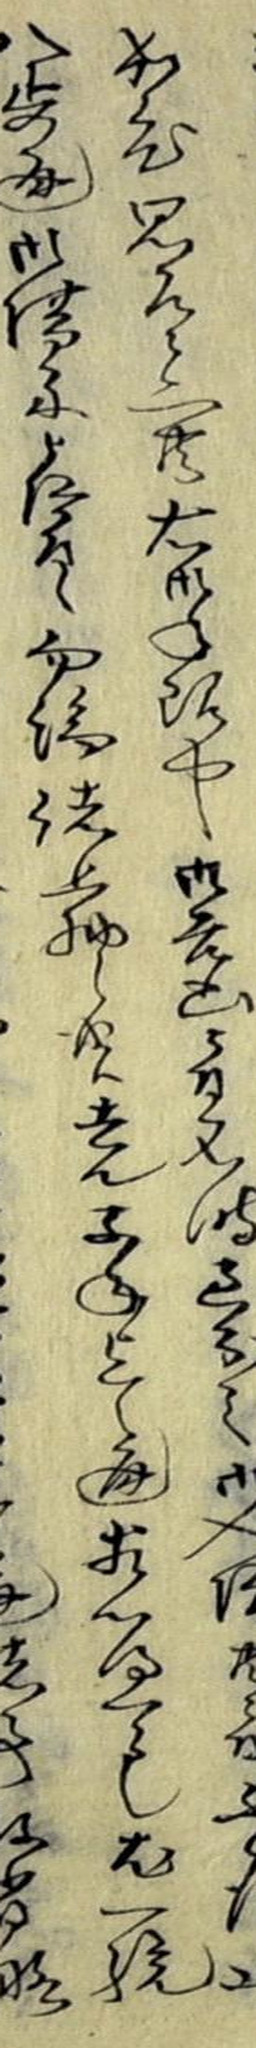八歩通御借米被仰付候勿論諸上納之儀ハ去ル子年迄之通相心得可申候尤一統
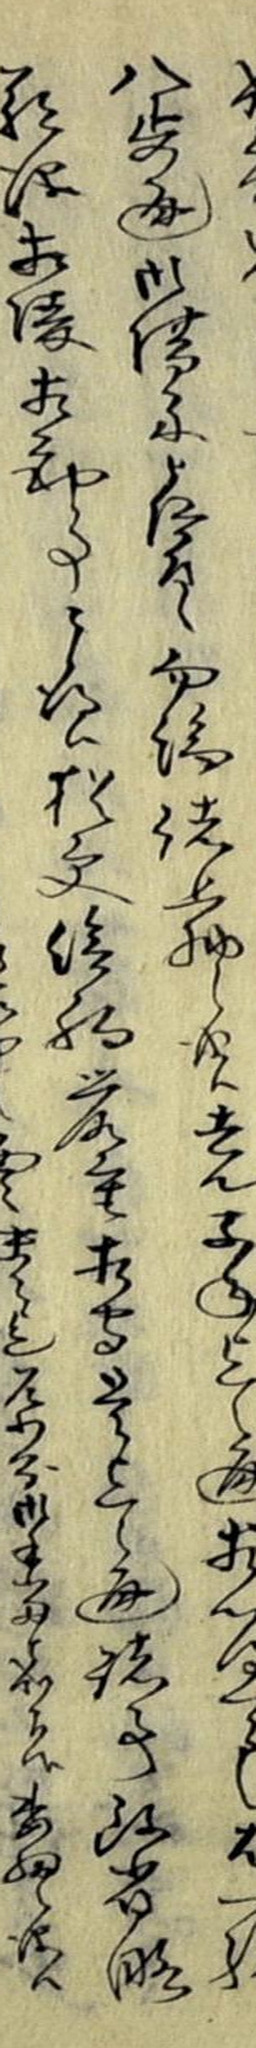難儀相凌相勤事ニ候得ハ猶更倹約厳重相守是迄之通諸事致省略
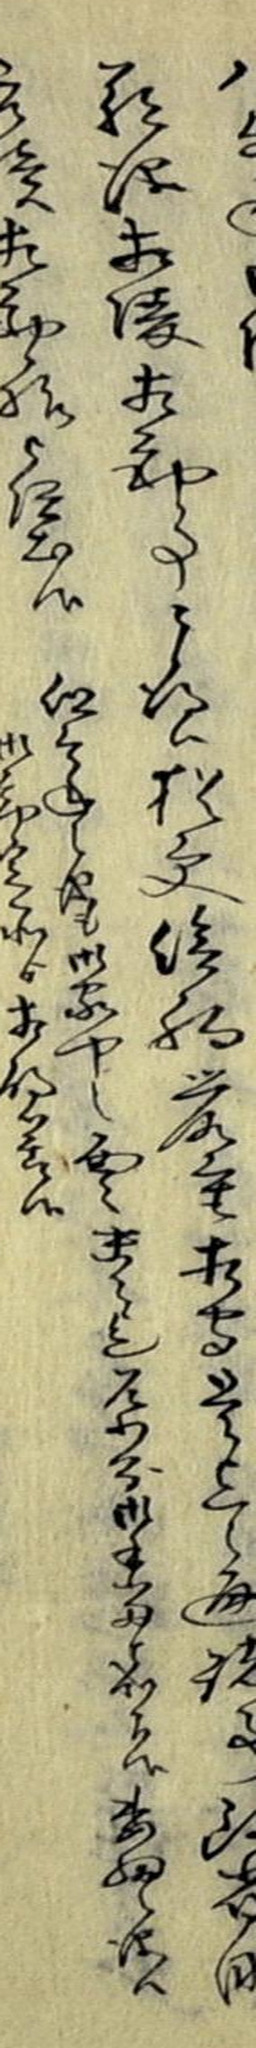取続相勤候様被仰出候但今年之儀も御家中之面々末々迄乍少分御手当被成下候委細之儀ハ
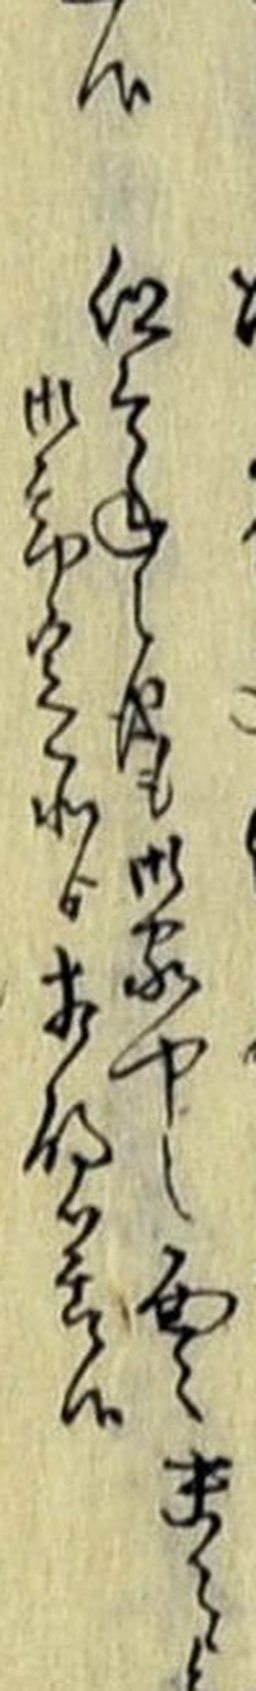御勘定所ゟ相触筈候
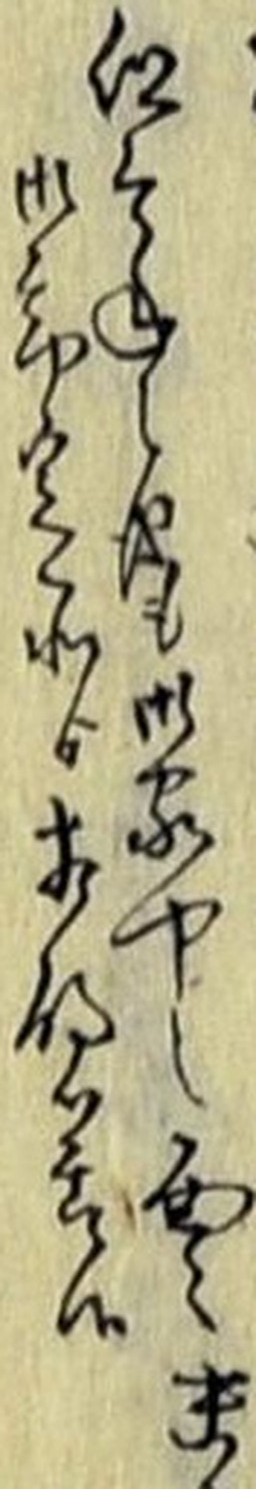御勘定所ゟ相触筈候
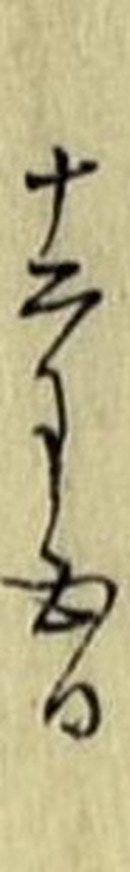十一月廿日
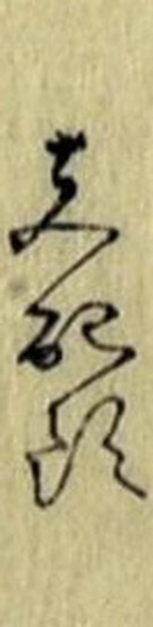支配頭
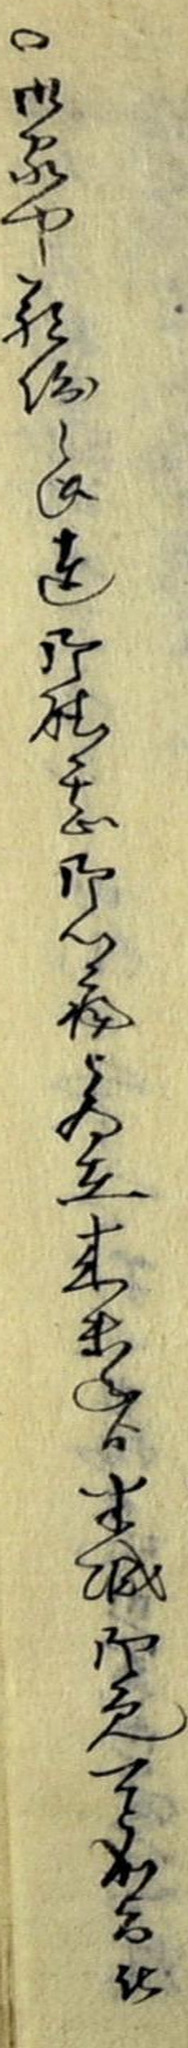○御家中難儀之趣達御聴甚御心痛被為在来未年ゟ半減御免可被成旨被

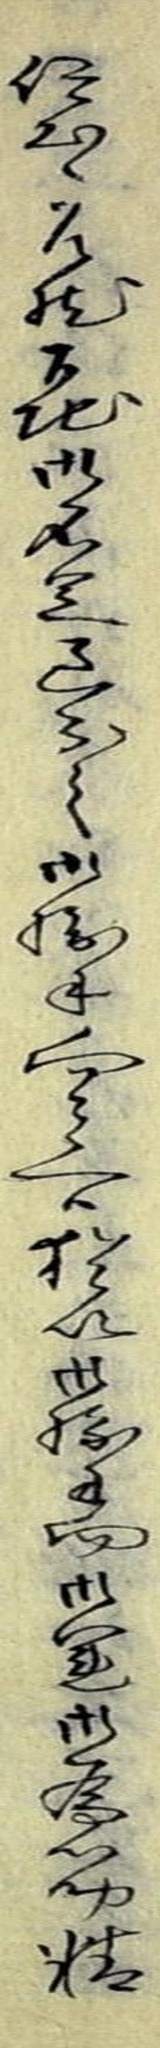仰出候乍然下地御不宜過分之御勝手向ニ候へハ猶以御勝手向御運御為筋精
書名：命令之部 五
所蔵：福井県文書館 Fukui Prefectural Archives
